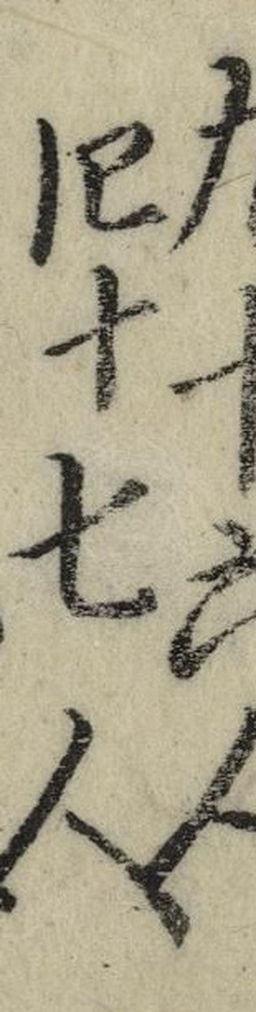女十七人
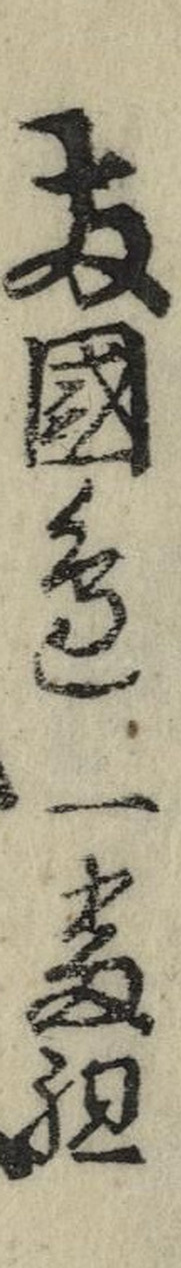両国辺一番組
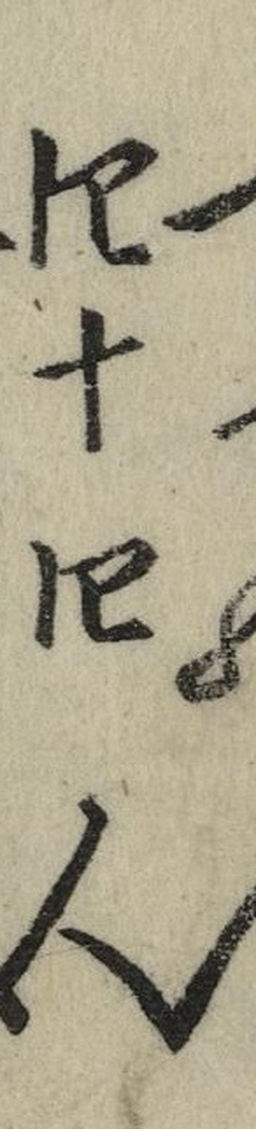内男四十四人
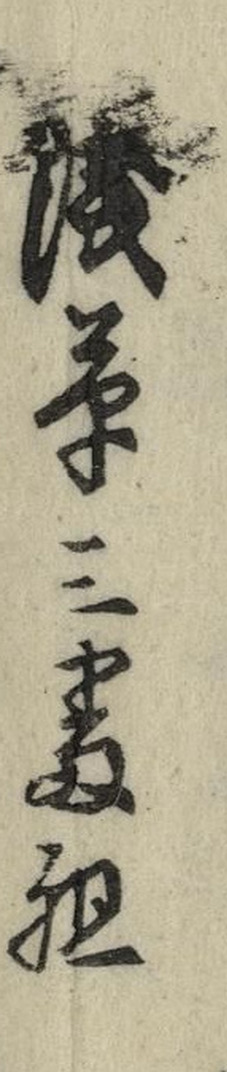浅草三番組
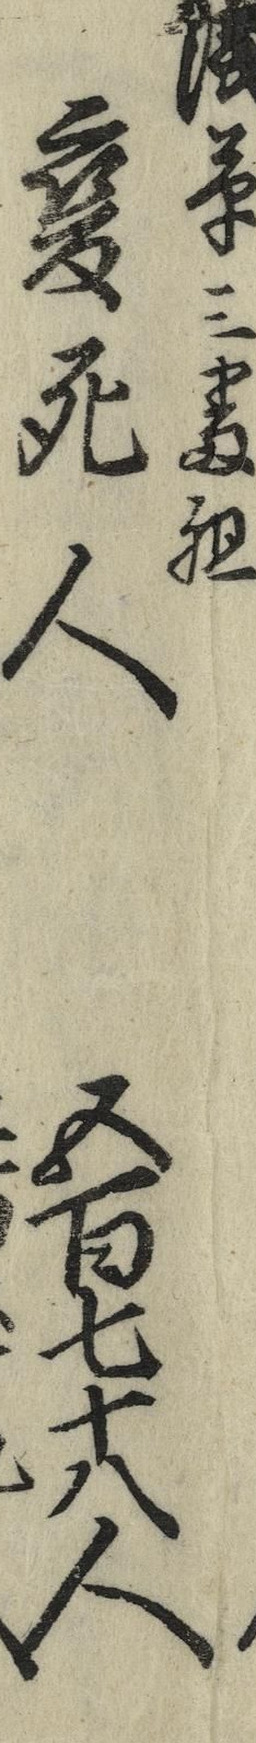変死人五百七十八人
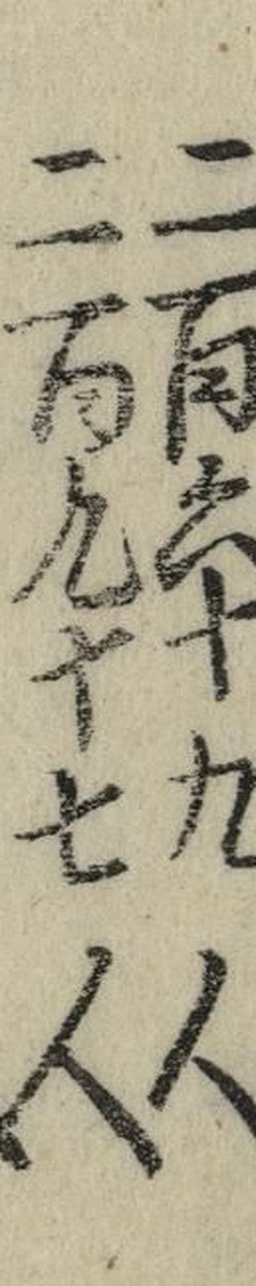女二百九十七人
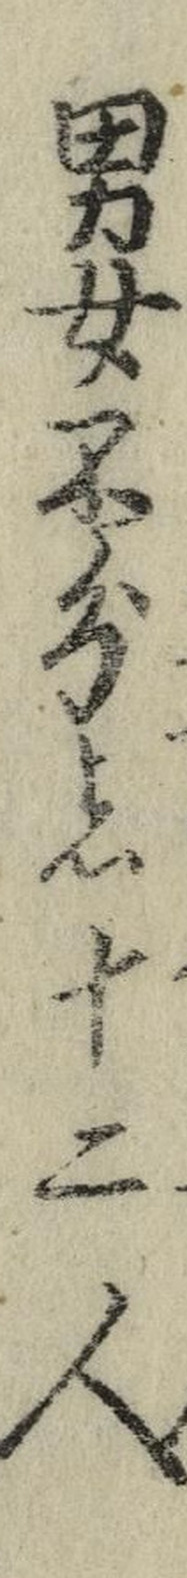男女不分者十二人
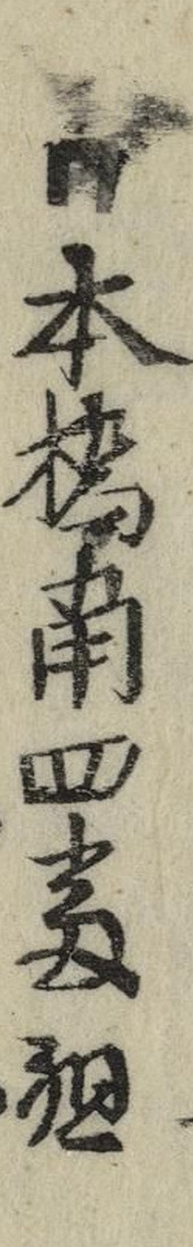日本橋南四番組
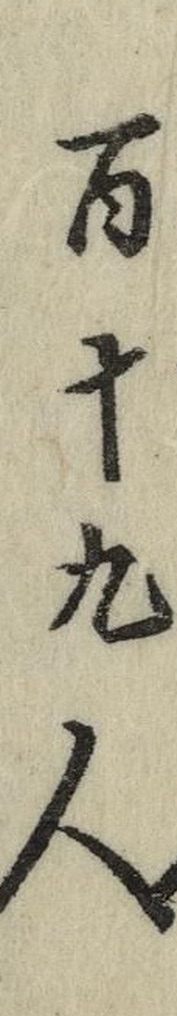女百十九人
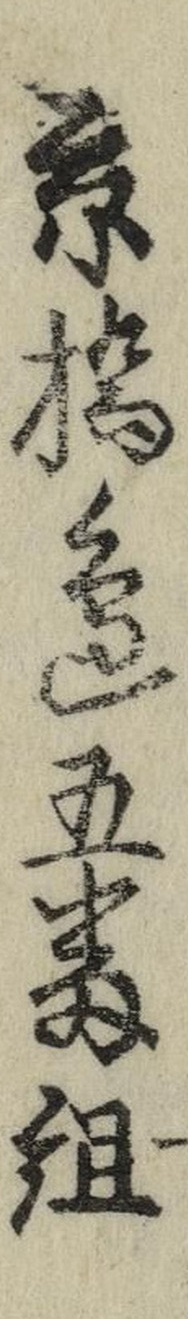京橋辺五番組
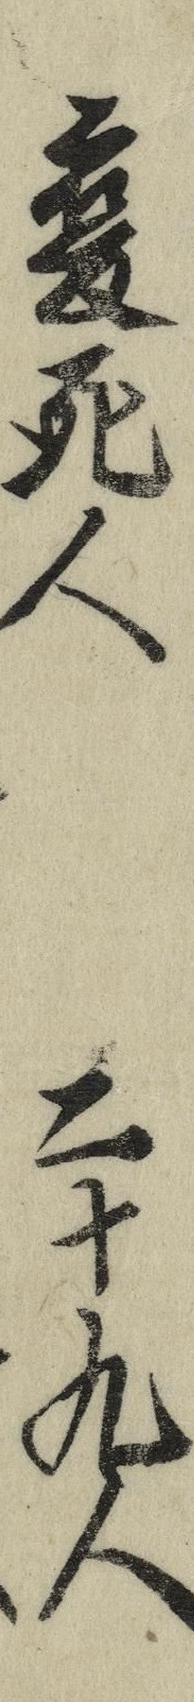変死人二十九人
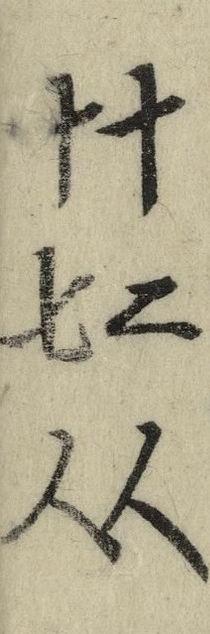女十七人
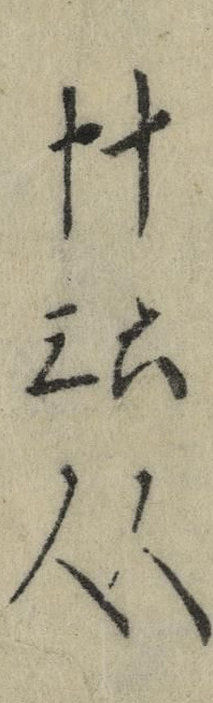女十三人

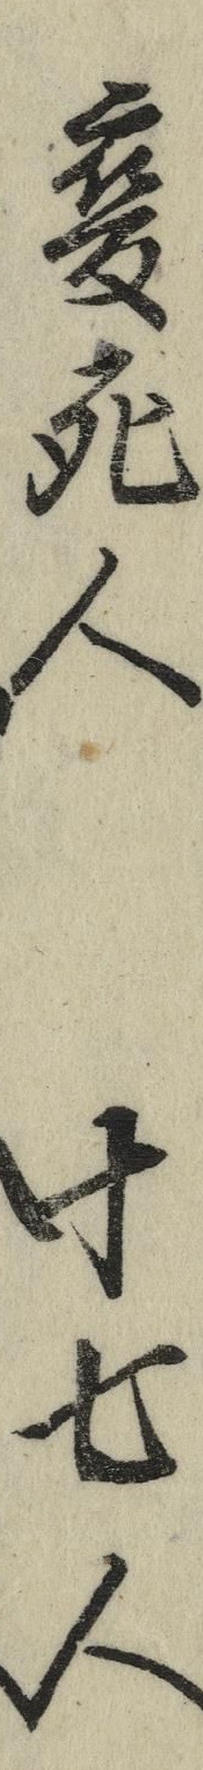変死人十八人
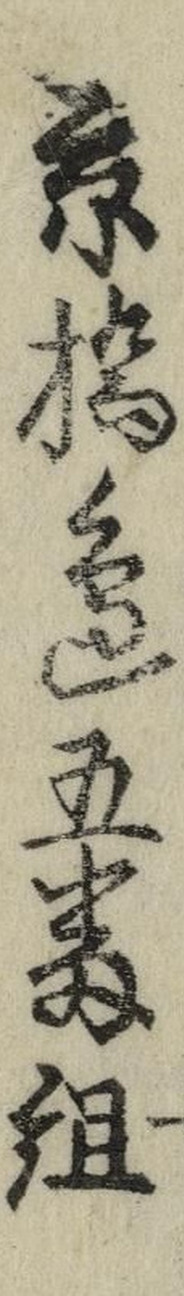新橋辺六番組
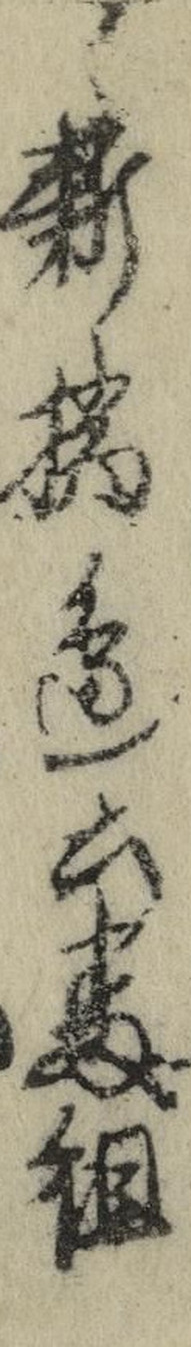新橋辺六番組
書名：地震出火　男女死人怪我人書上之冩
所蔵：東京大学地震研究所図書室 Earthquake Research Institute Library, The University of Tokyo, JAPAN
